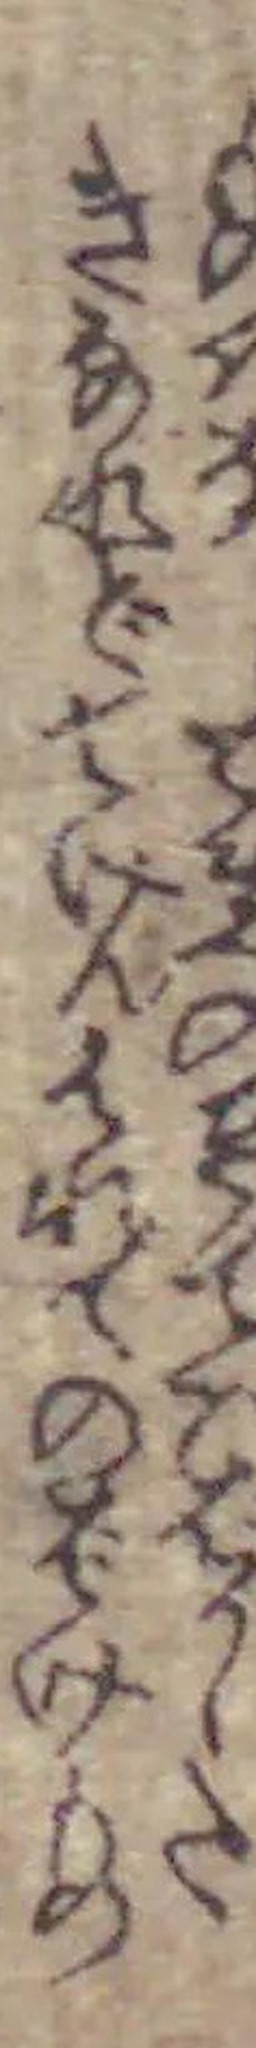きなれどはけんれてのばけものなり
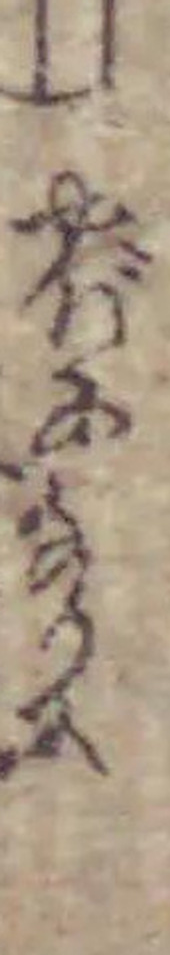やぼななりに
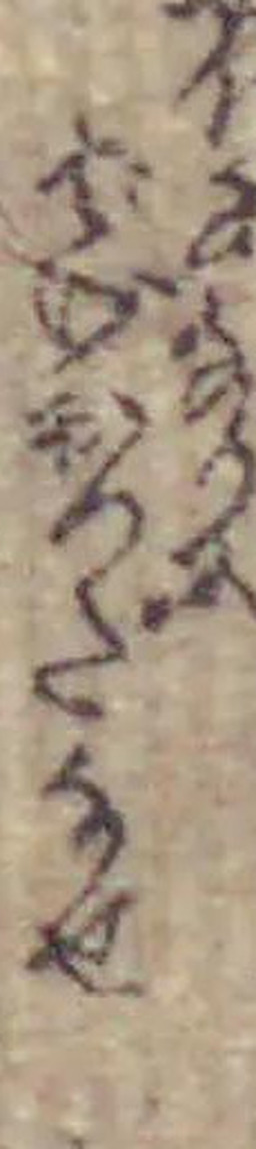ばけおつたなせ
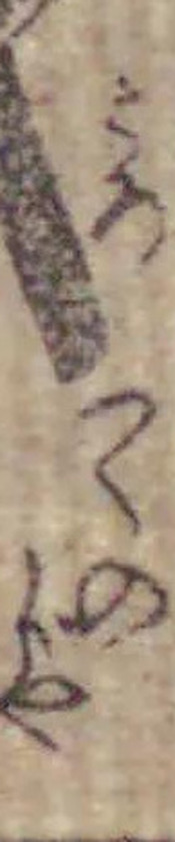うろつくの
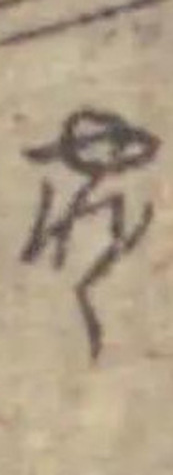やれ〳〵

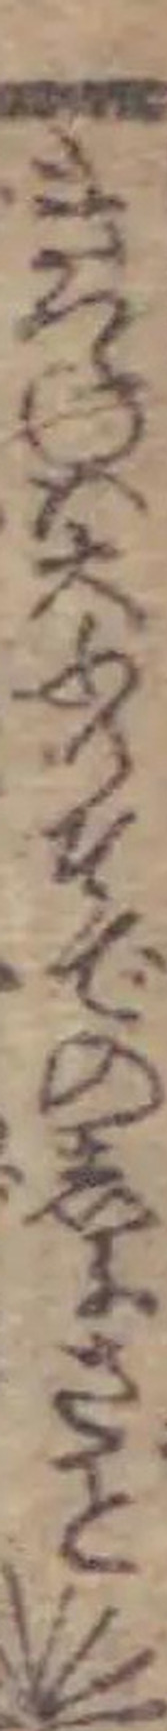きつねは大ふりそでのしよさごと
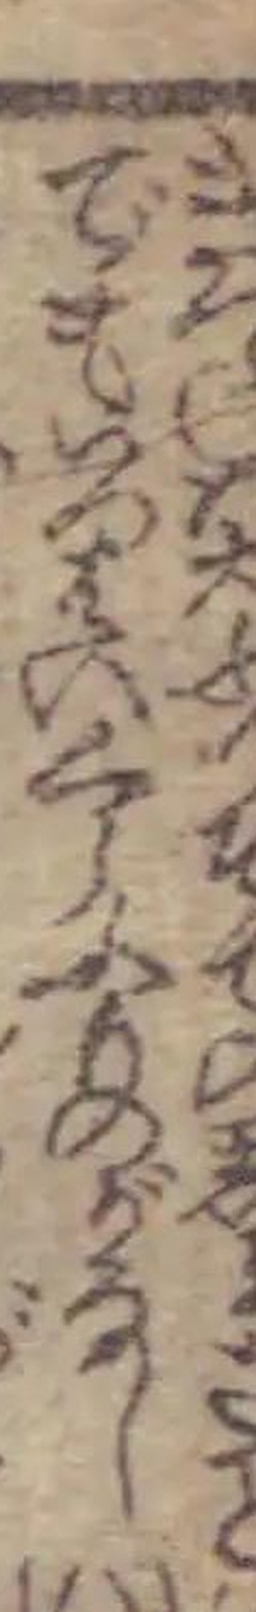でもいつはいくらふものがなし
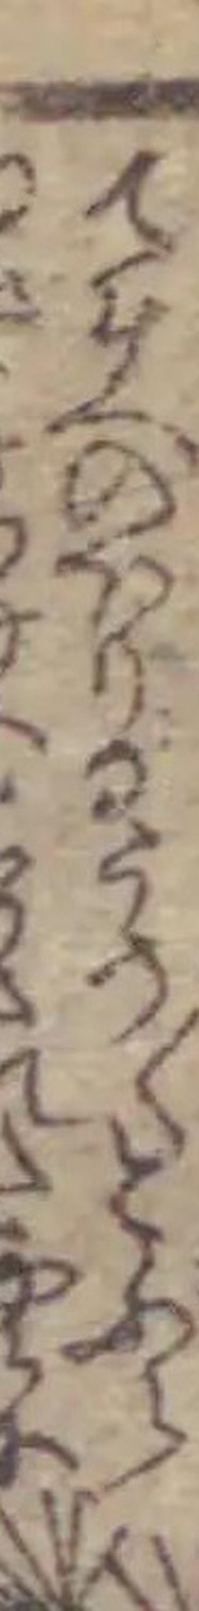てまへのほうがうつ〳〵とぶら
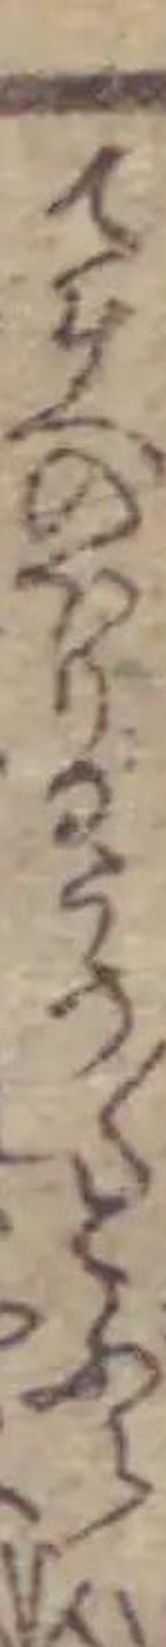てまへのほうがうつ〳〵とぶら
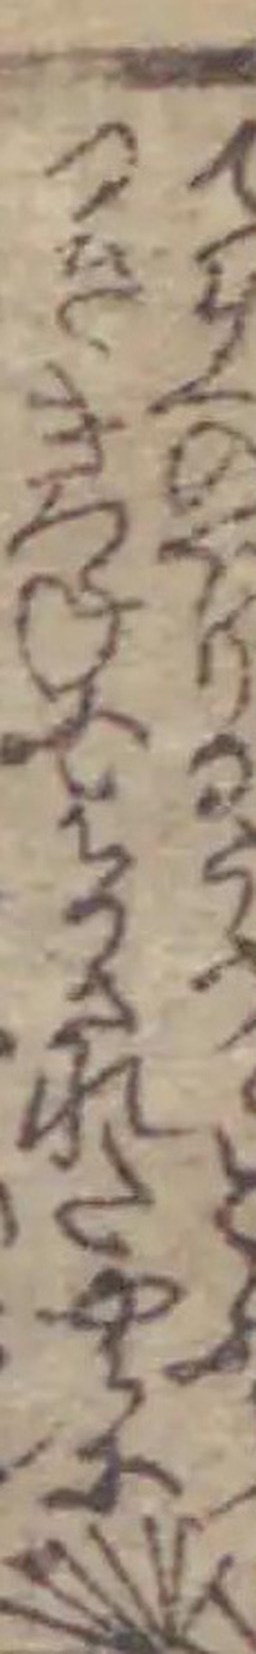つききつねにはかされたやうに
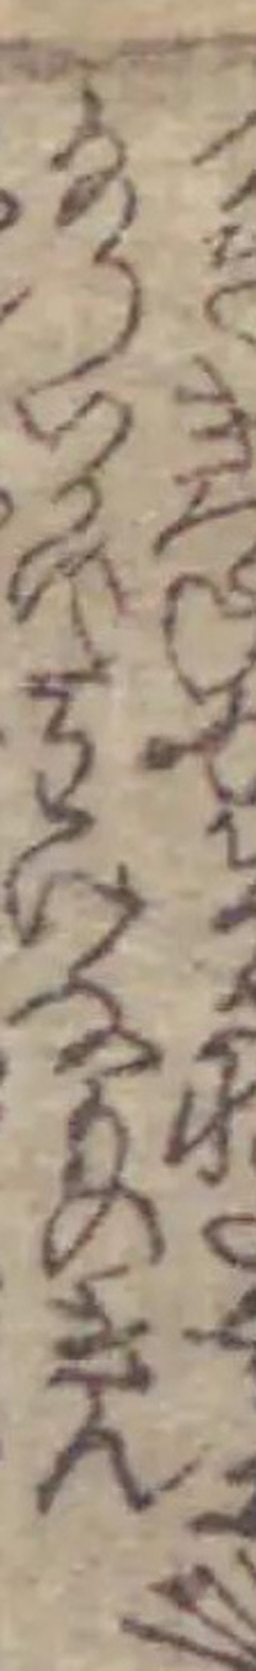なりいるはたわけなものきん
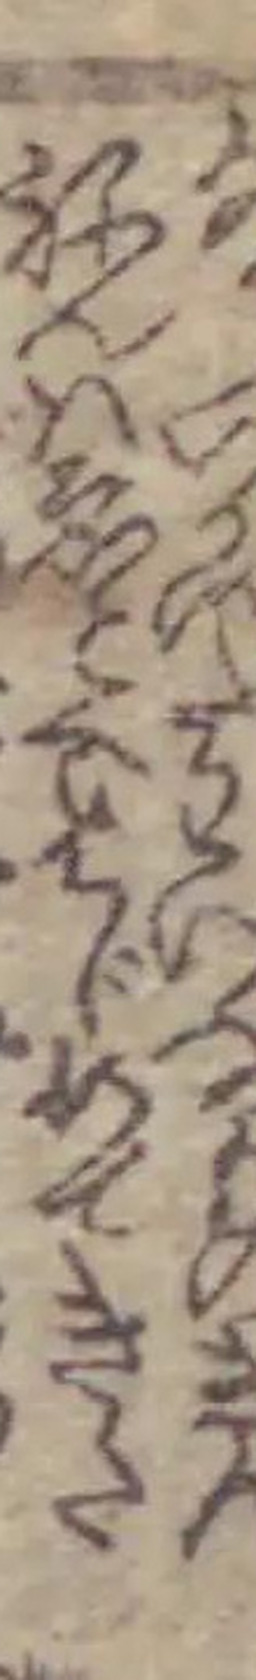ねんはゑとへはじめてきた
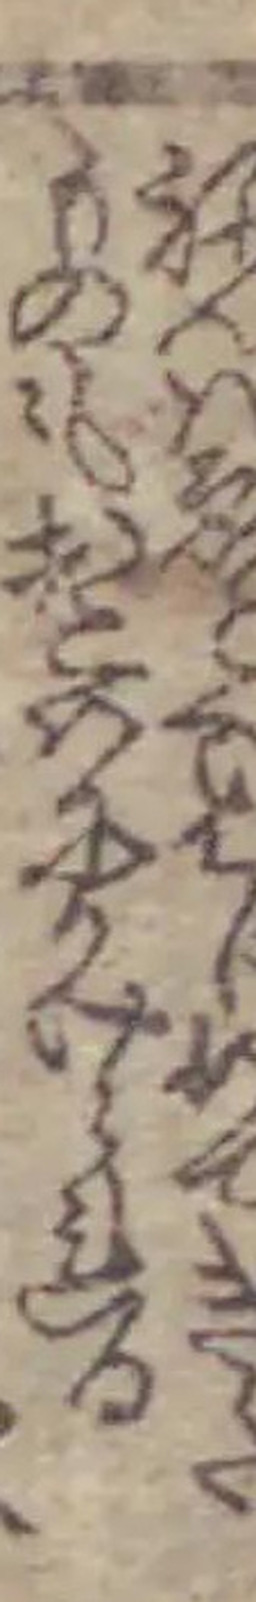ものもおこはにかけられる
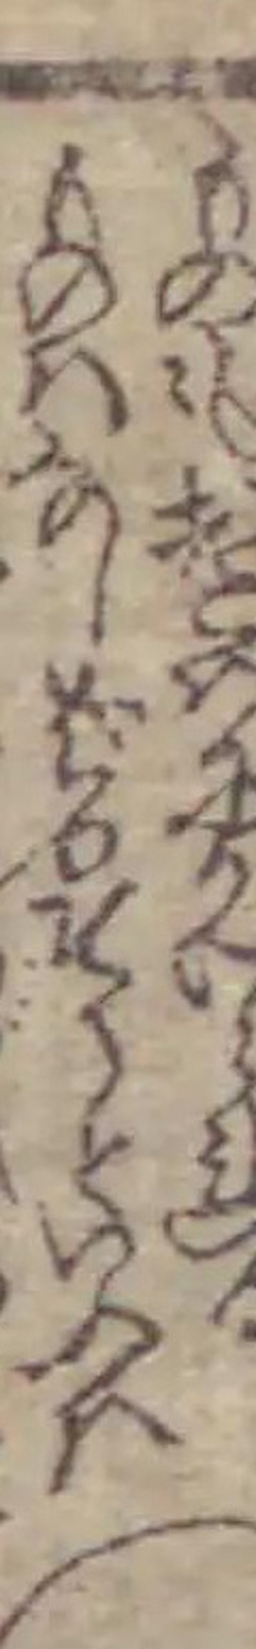ものはなしばかそうといふは
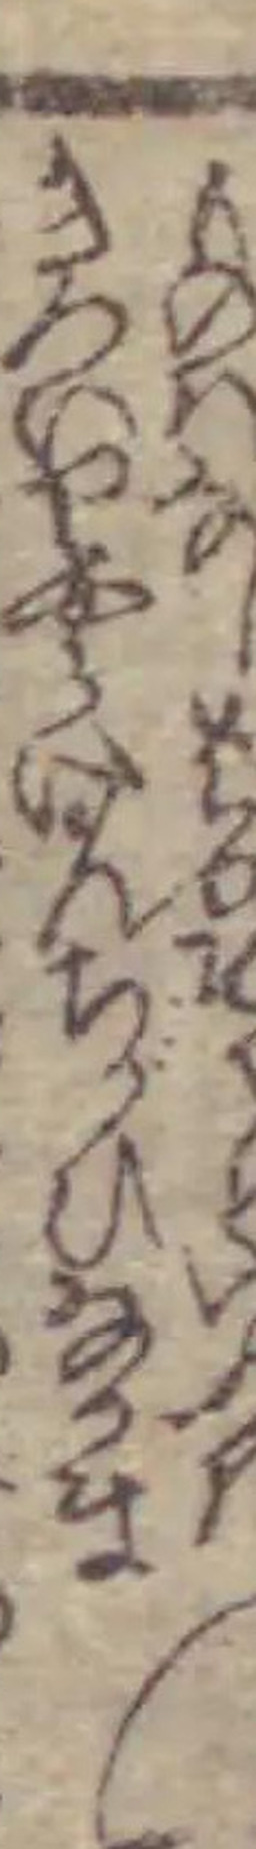きついりやうけんちがひなかま
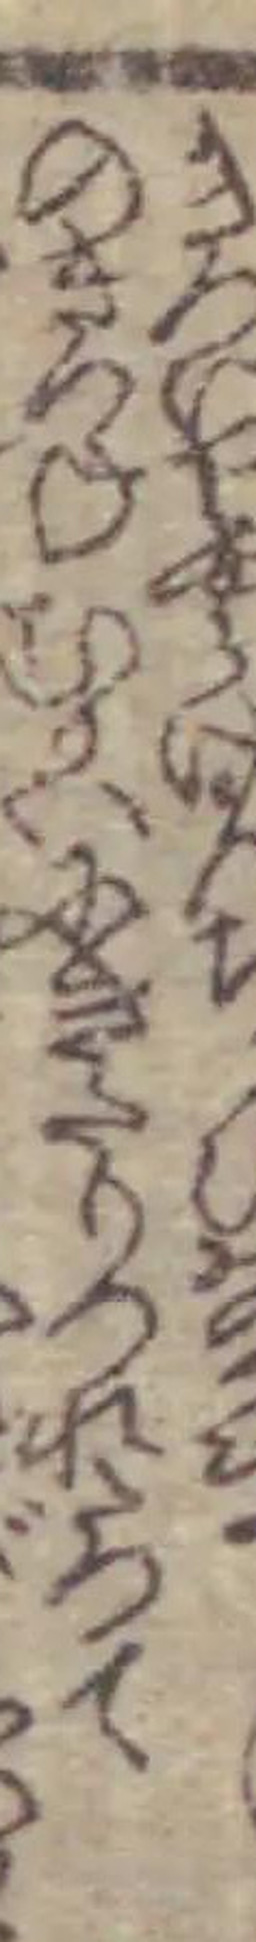のきつねむかいにきたりつれたつて
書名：化物昼寝鼾 2巻
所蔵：国立国会図書館 National Diet Library, JAPAN
